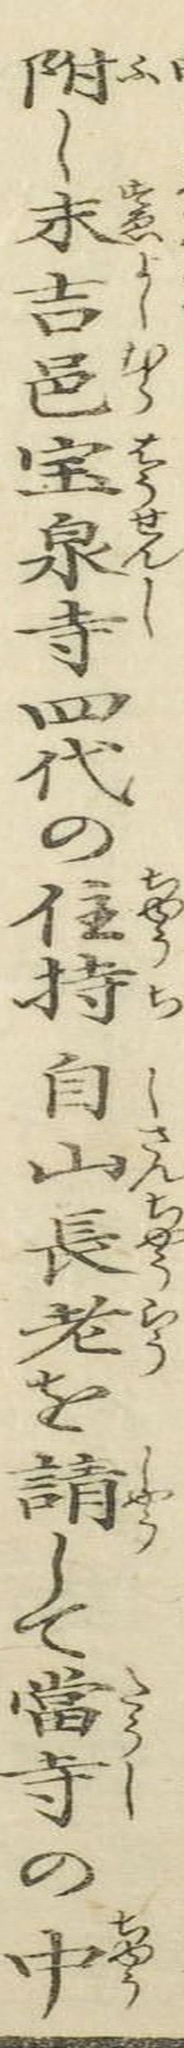附し末吉邑宝泉寺四代の住持自山長老を請して當寺の中
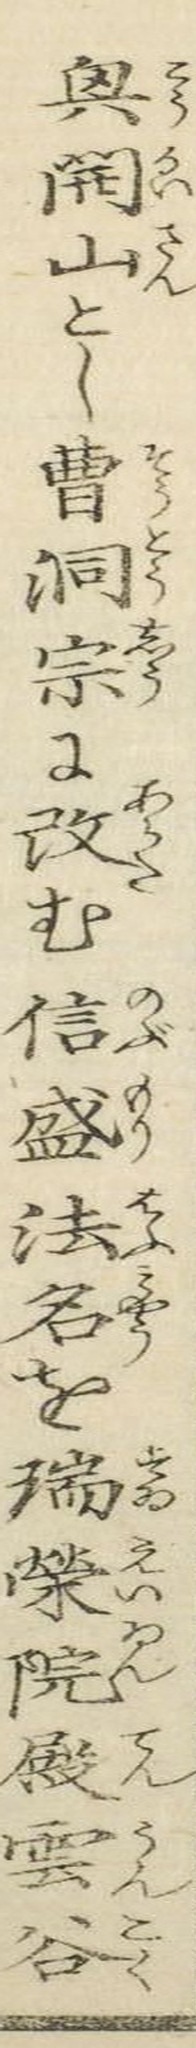興開山とし曹洞宗に改む信盛法名を瑞榮院殿雲谷
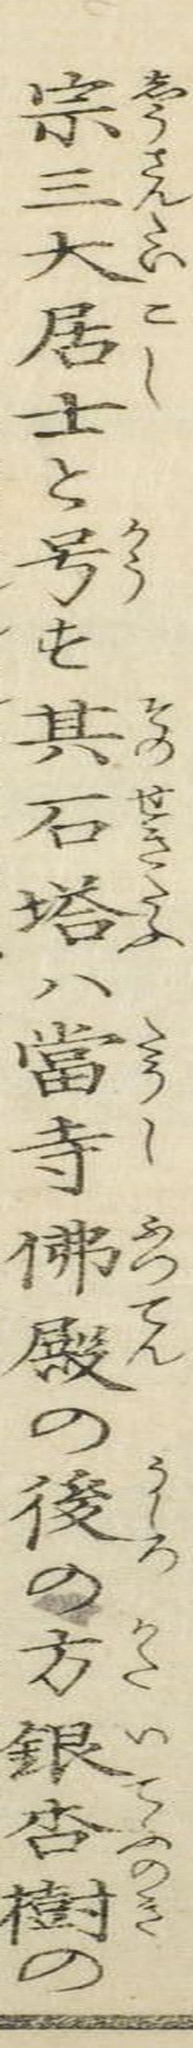宗三大居士と号す其石塔は當寺佛殿の後の方銀杏樹の
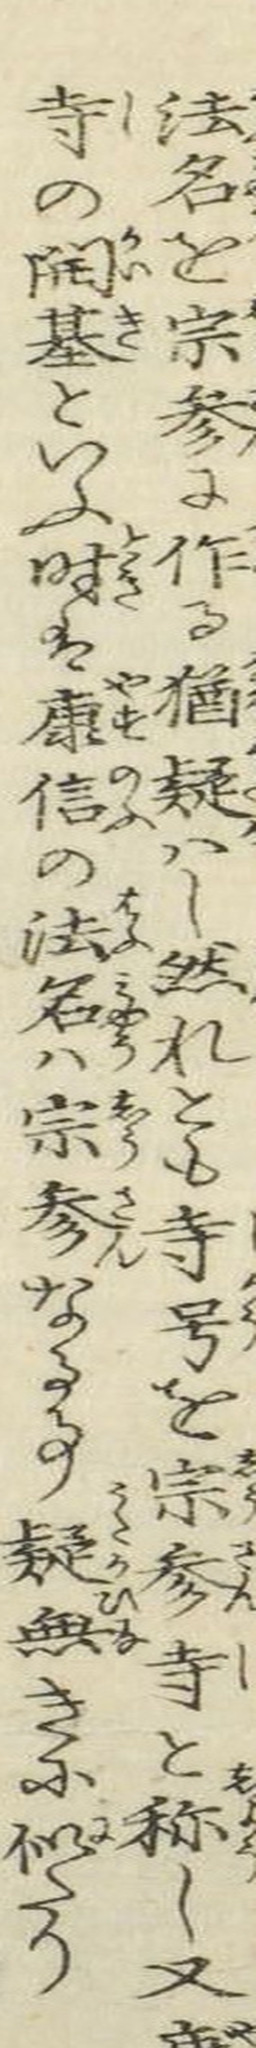寺の開基といふ時は康信の法名は宗参なる事疑無きに似たり
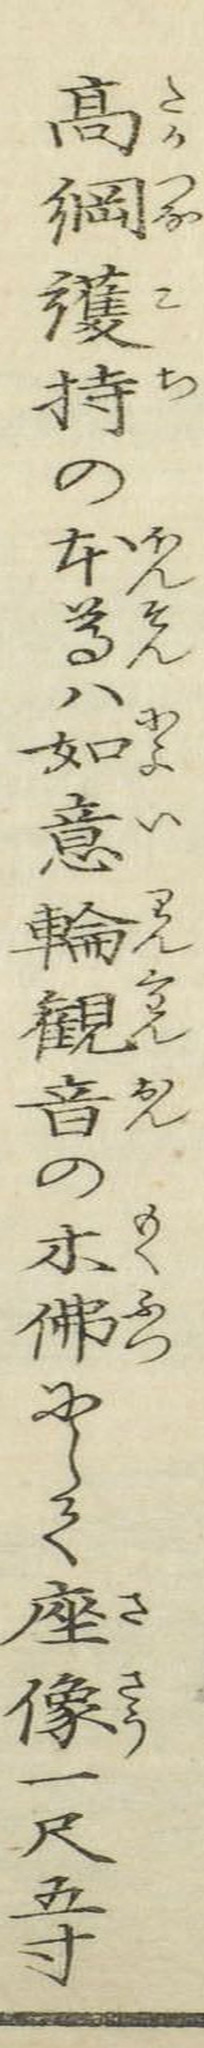高綱護持の本尊は如意輪観音の木佛にして座像一尺五寸
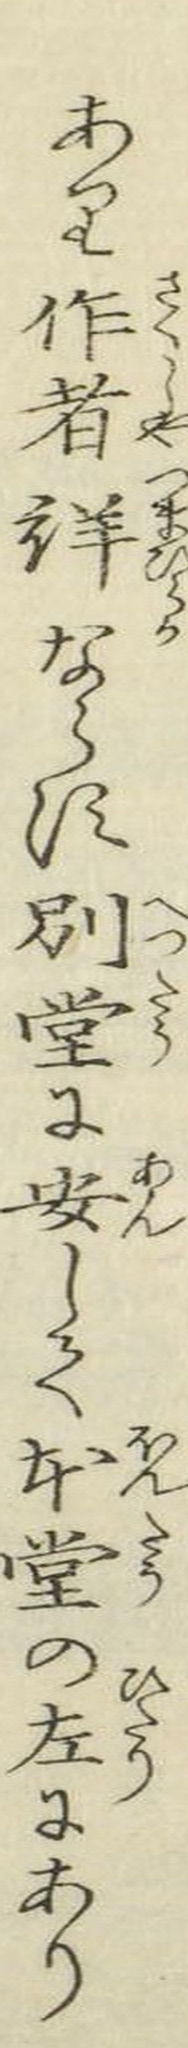あり作者詳ならす別堂に安して本堂の左にあり
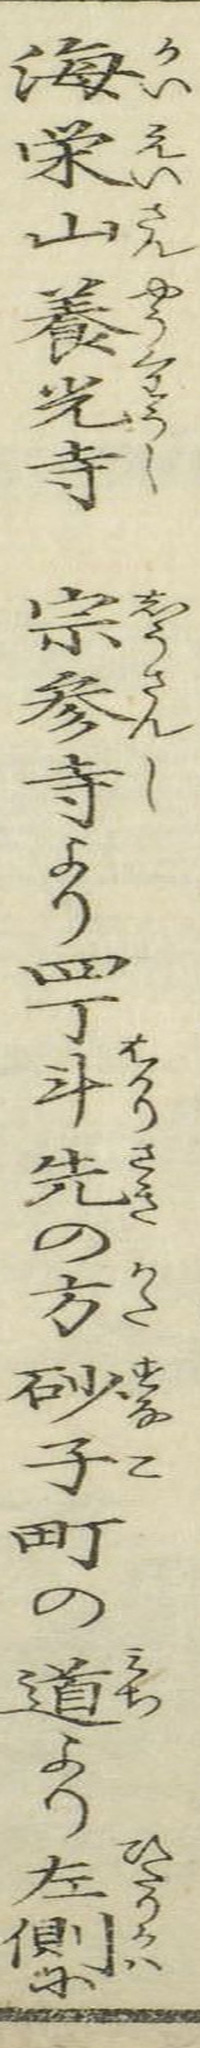海栄山養光寺宗参寺より四丁斗先の方砂子町の道より左側に
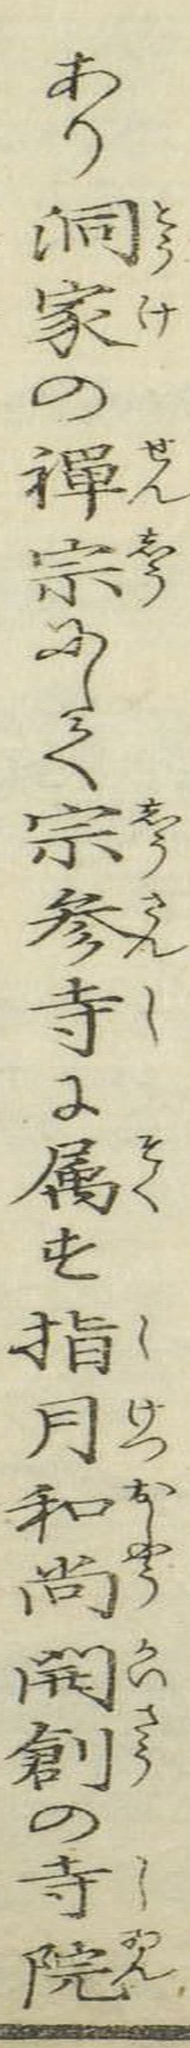あり洞家の禅宗にして宗参寺に属す指月和尚開創の寺院
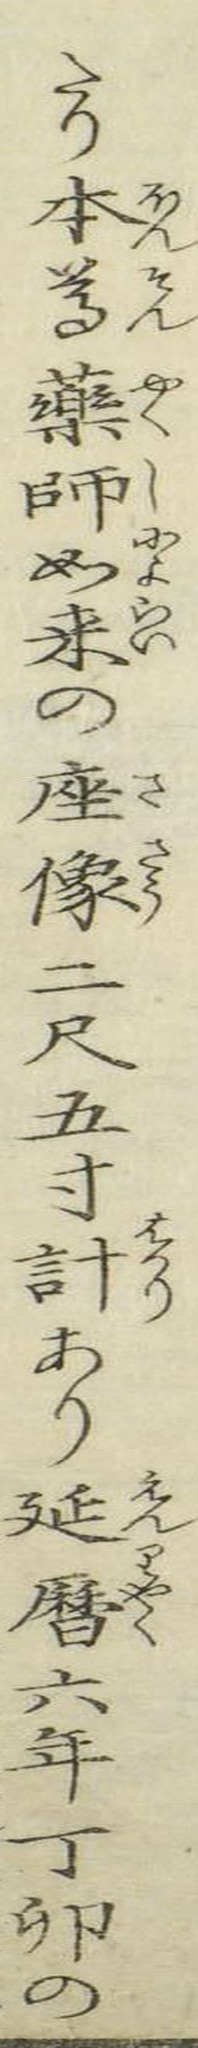たり本尊薬師如来の座像二尺五寸計あり延暦六年丁卯の

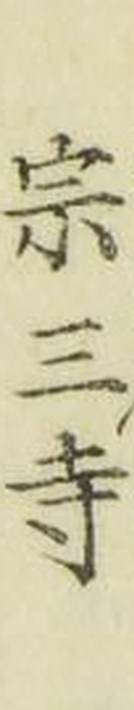宗三寺
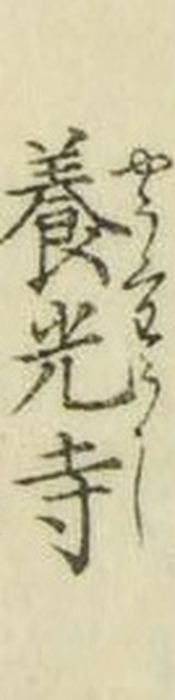養光寺
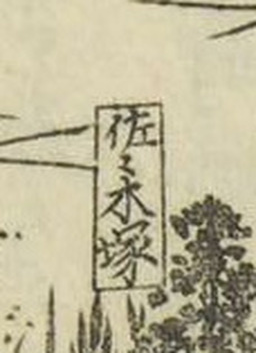佐々木塚
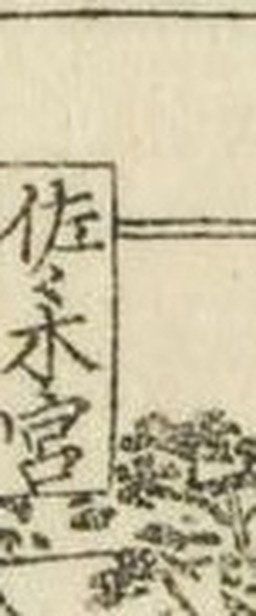佐々木宮
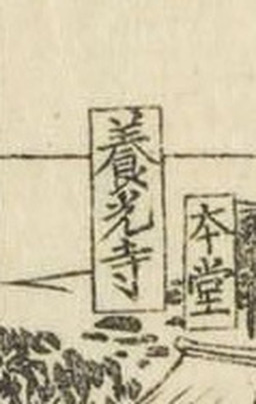養光寺

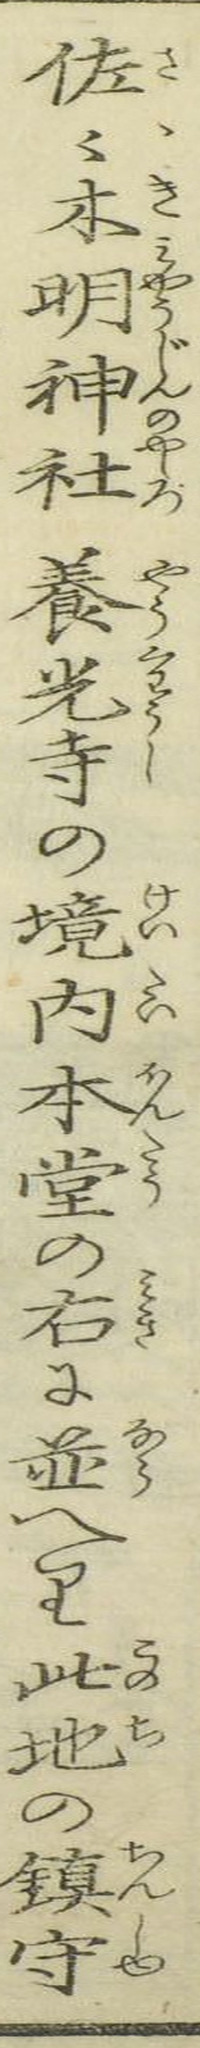佐々木明神社養光寺の境内本堂の右に並へり此地の鎮守
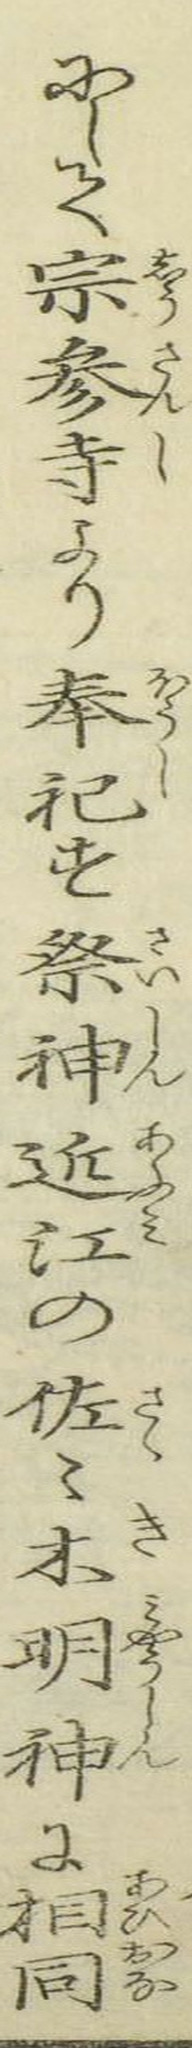にして宗参寺より奉祀す祭神近江の佐々木明神に相同
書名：江戸名所図会 20巻 巻之5
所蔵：東京学芸大学教育コンテンツアーカイブ
